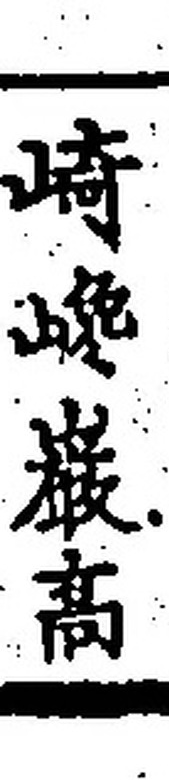崎巉巌高
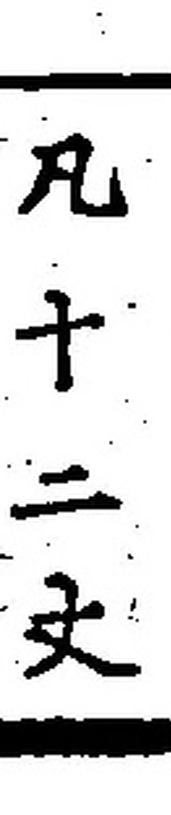凡十二丈
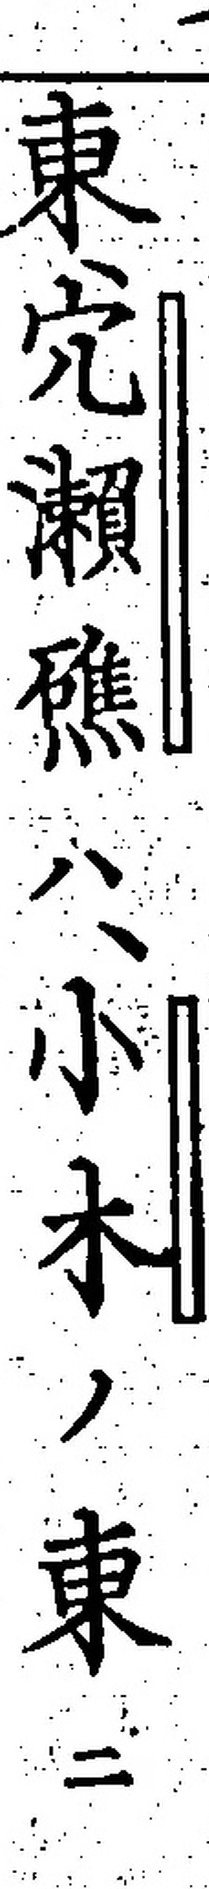東、穴瀬礁ハ、小木ノ東ニ
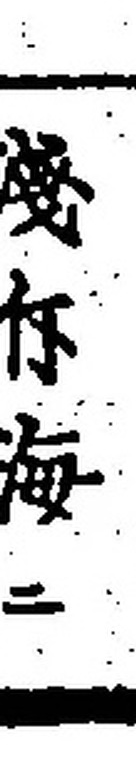浅斥海ニ
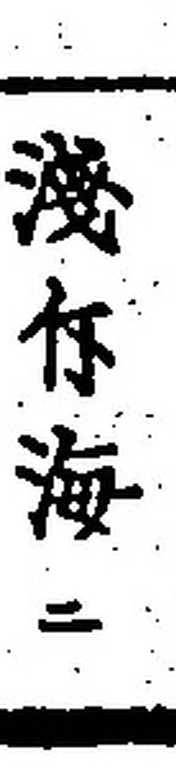浅斥海ニ
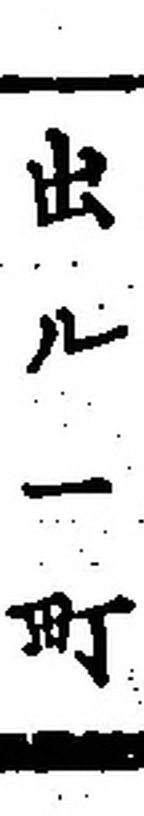出ル一町
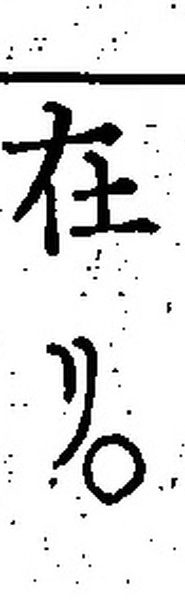在リ。
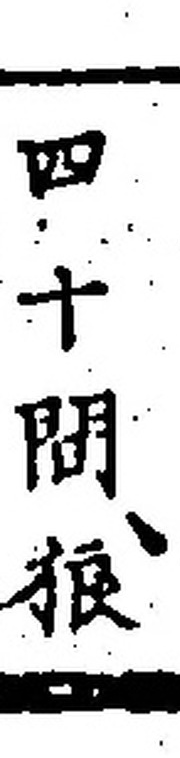四十間、狼
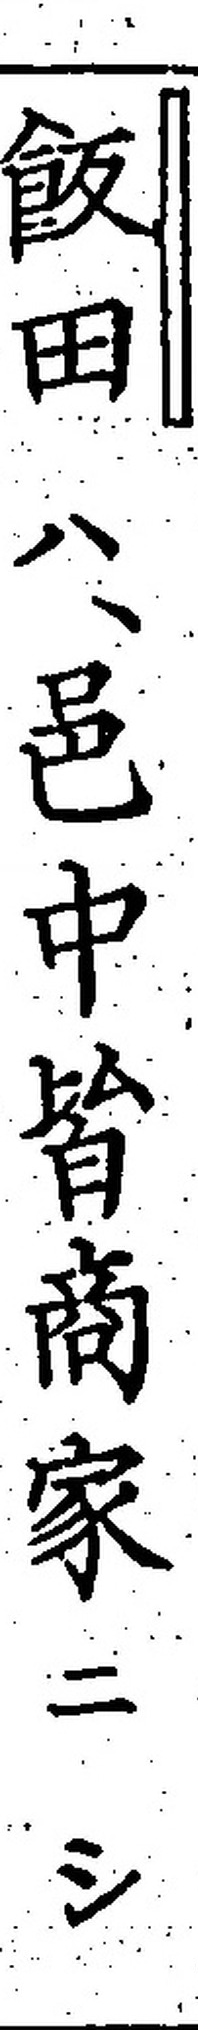飯田ハ、邑中皆商家ニシ
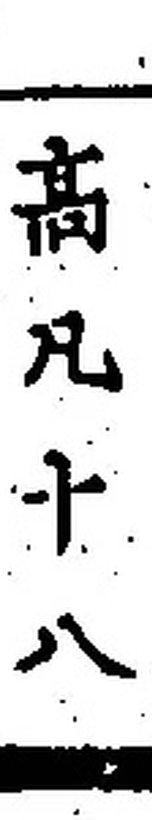高凡十八
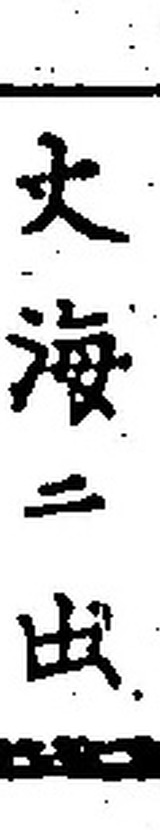嘴海ニ出
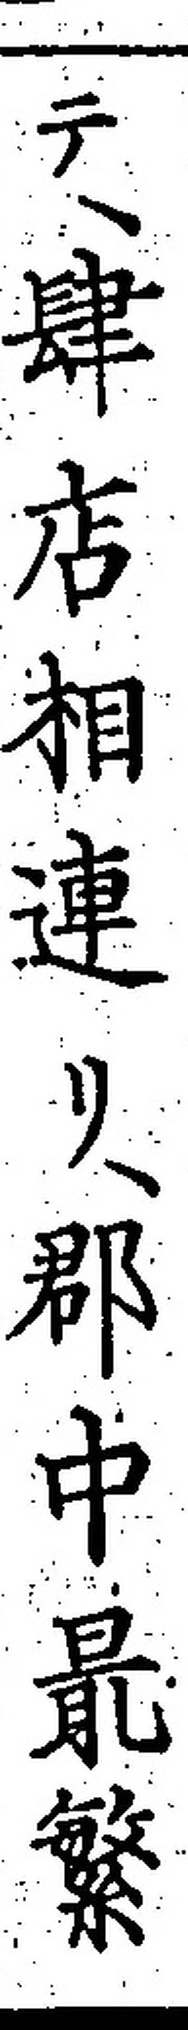テ、肆店相連リ、郡中最繁
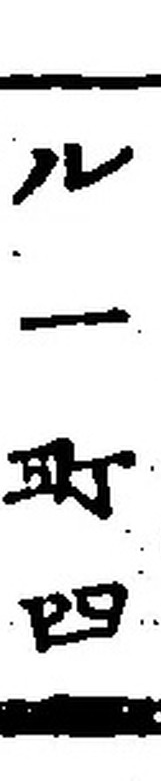ル一町四
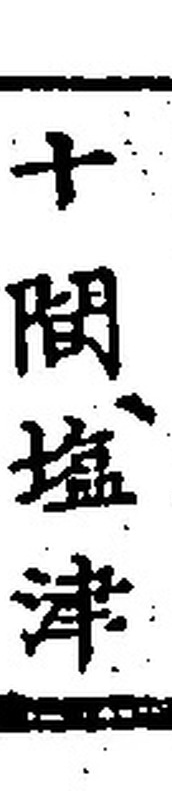十間、塩津
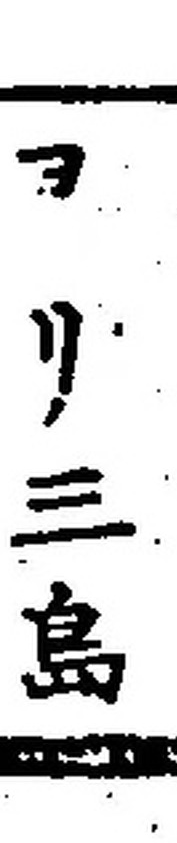ヨリ三島
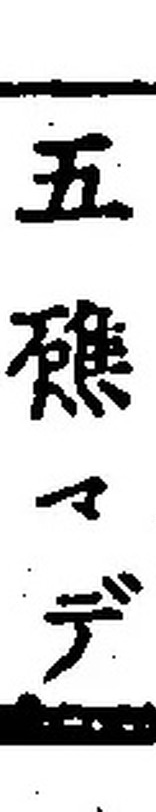五礁マデ
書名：能登地誌略
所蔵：国立国会図書館 National Diet Library, JAPAN
